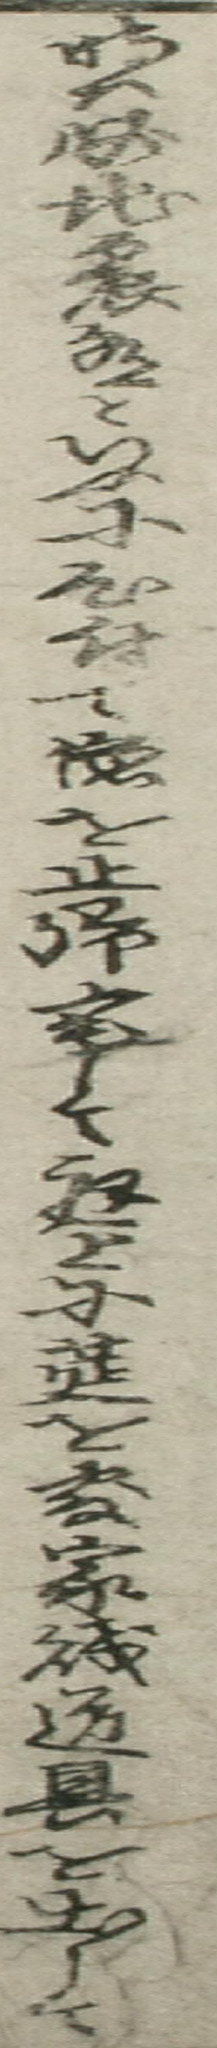時は必地震有といふに心付て漁を止帰宅して庭上に莚を敷家財道具を出して
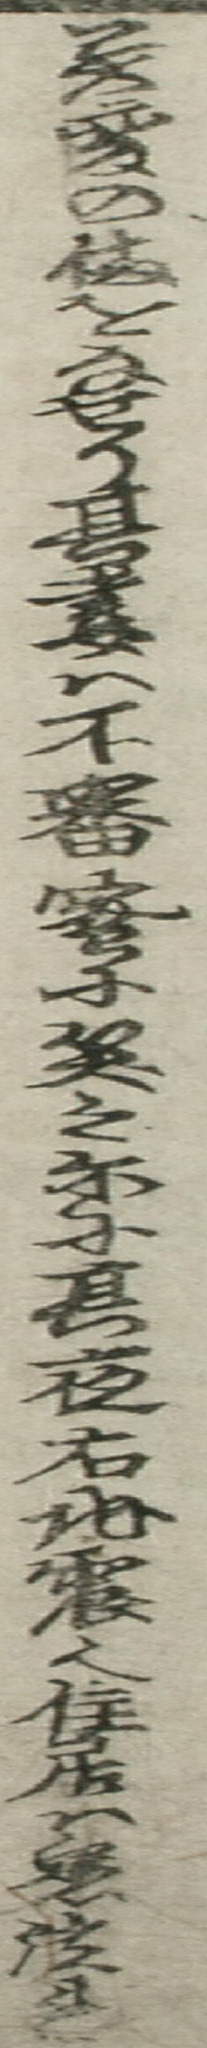異変の備をなせり其妻は不審蜜に笑之尓に其夜右地震也住居は悉潰れ
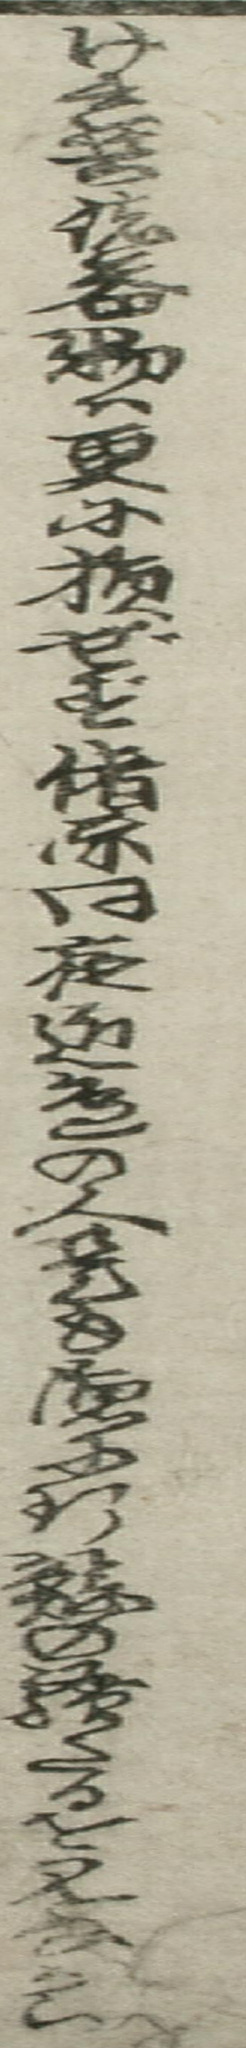けれ共諸器物は更に損ぜず偖亦同夜近辺の人是も漁に行鯰の騒たるを見なから
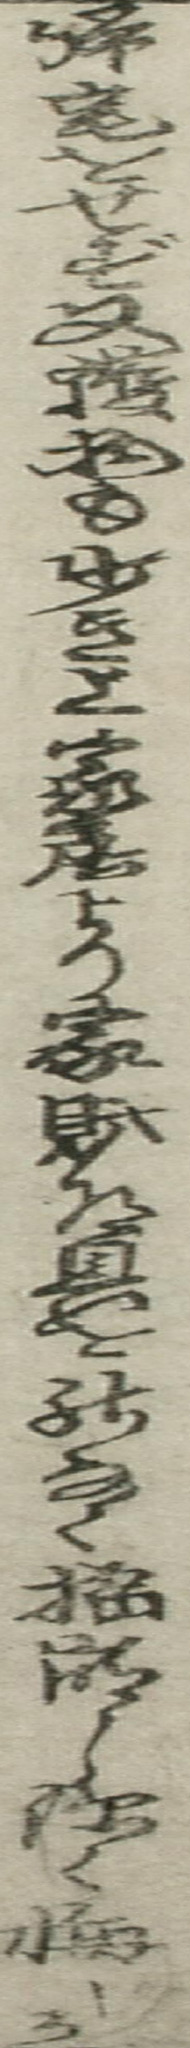帰宅をせず又獲物も少き上家居より家財道具を残なく揺崩し深く悔しか
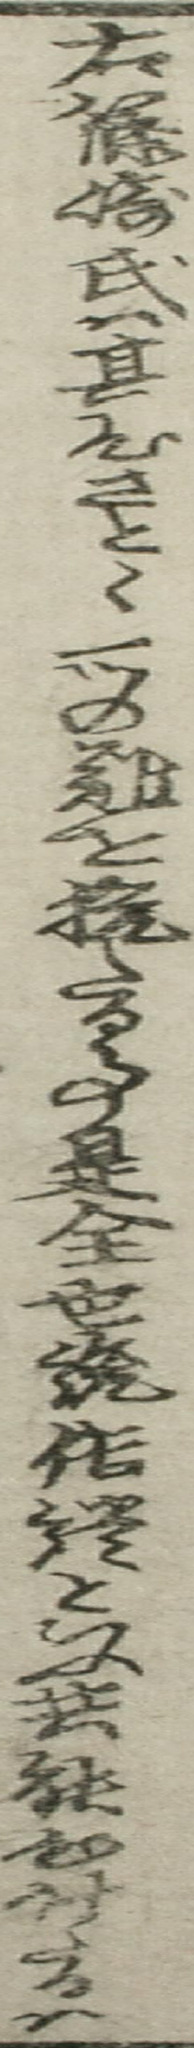右篠崎氏は其心さとく一ツの難を脱たる事是全世説俗談といふ共能心付たるは
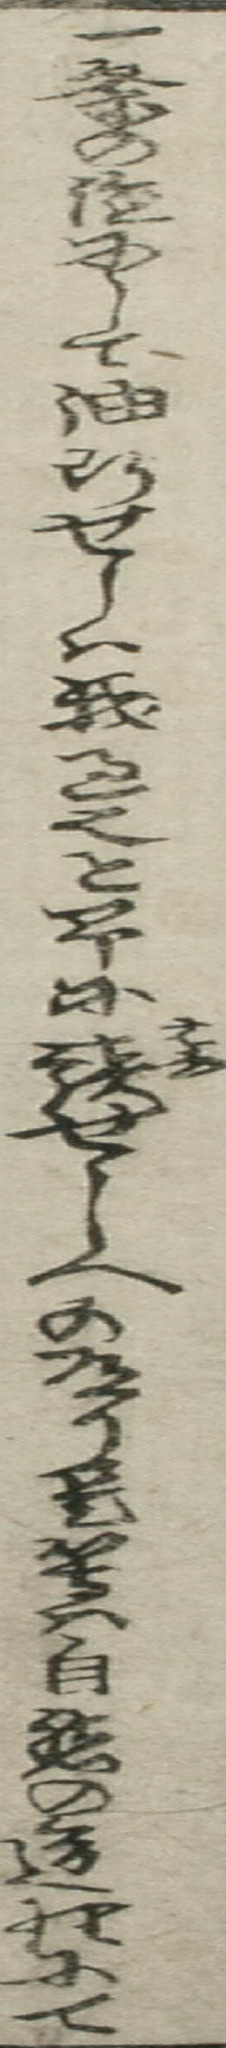一条の徳にして油断せしは我過也と予に談せし人の有り是等は自然の道理にて
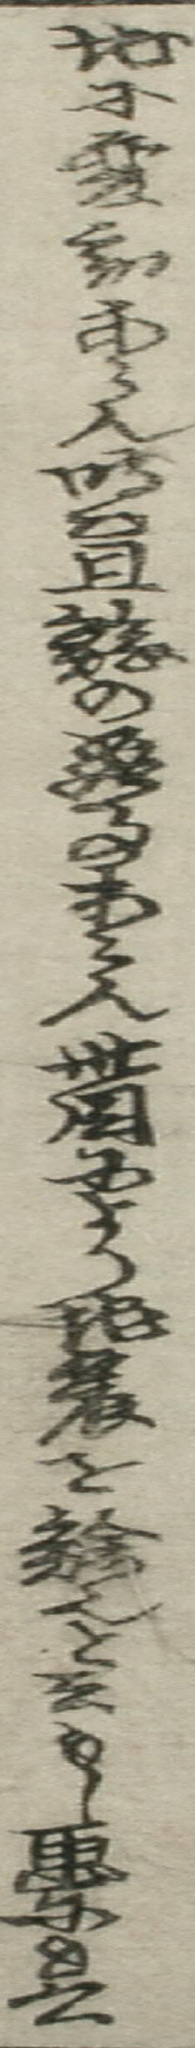地に変動あらん時は且鯰の騒事あらん此因により地震を鯰也と云もし画にも書
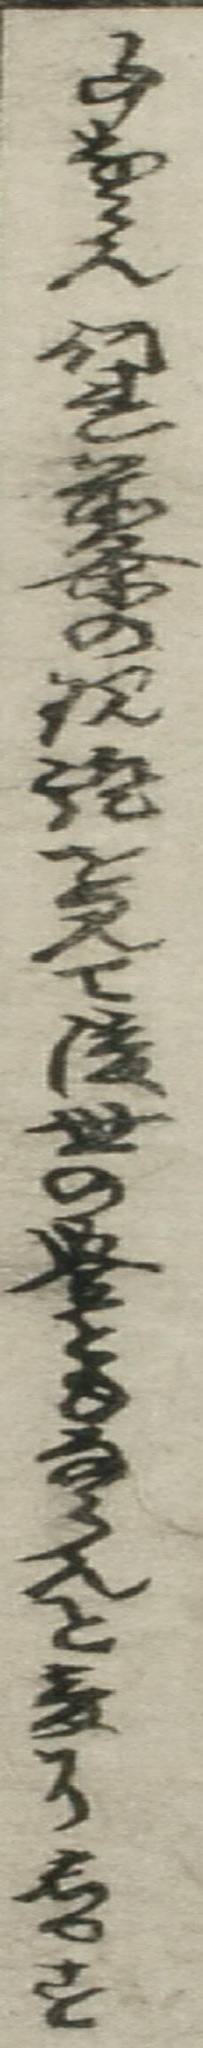事ならん何れ前条の現證を見て後世の鑑ともならんと爰にしるす

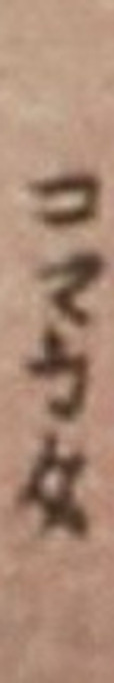コマカタ
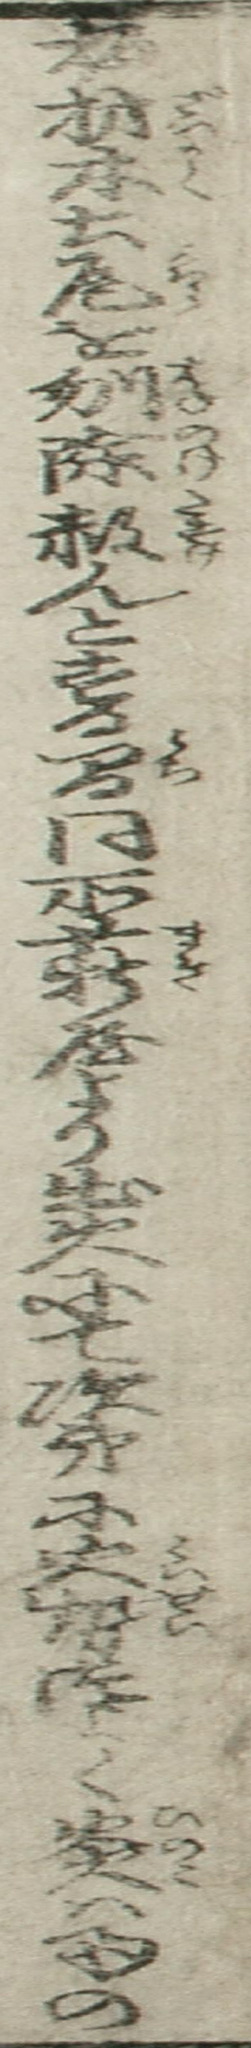板材木土瓦を刎除赦んとする間同所薪屋より出火にて次第に火勢つよく炎は雨の
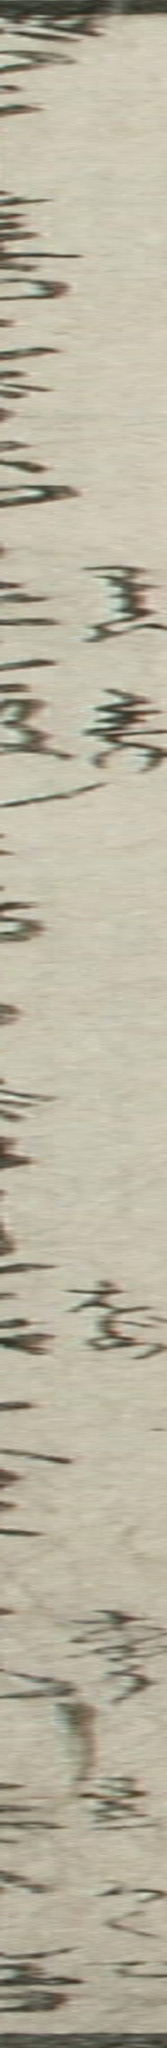ごとし妻やすが云やう妾を赦んとて時うつれば御身を始三人の子迄危し妾は覚悟

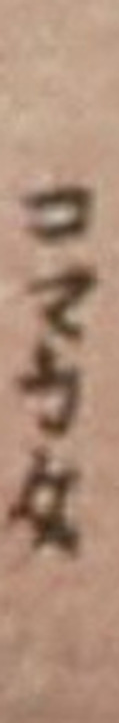コマカタ
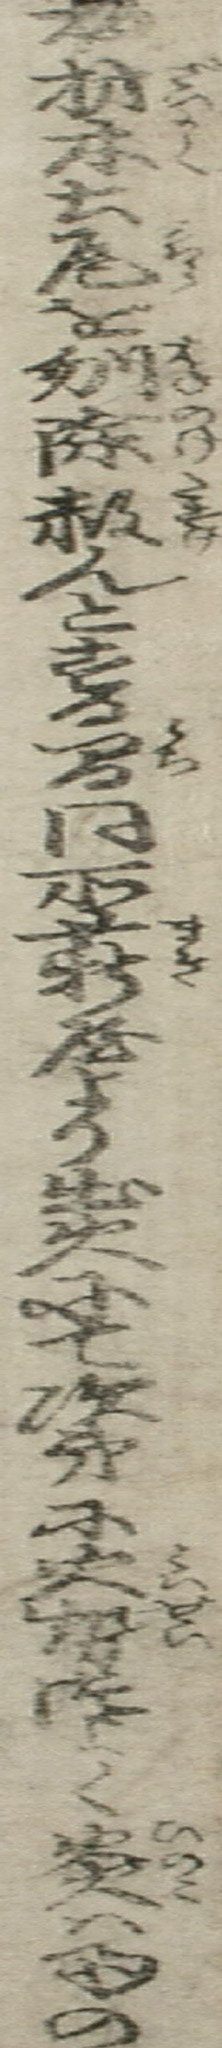板材木土瓦を刎除赦んとする間同所薪屋より出火にて次第に火勢つよく炎は雨の
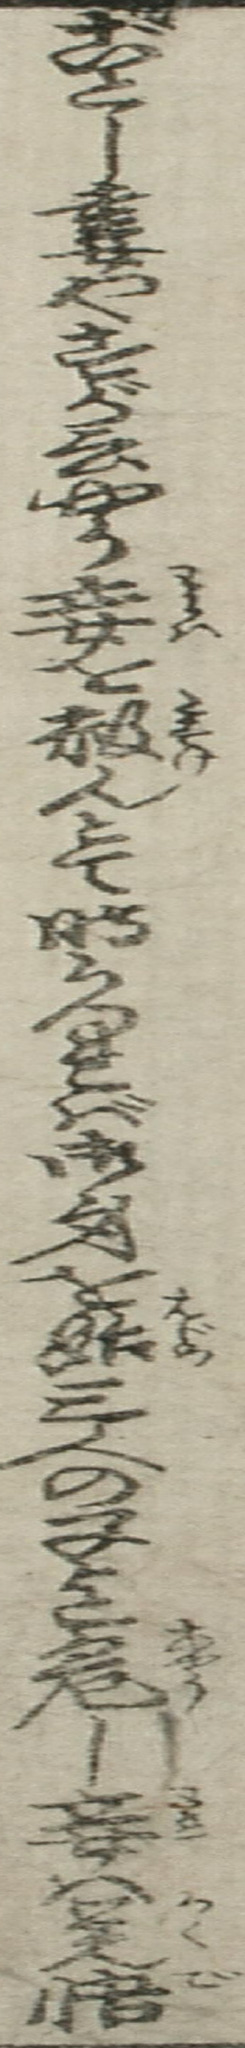ごとし妻やすが云やう妾を赦んとて時うつれば御身を始三人の子迄危し妾は覚悟
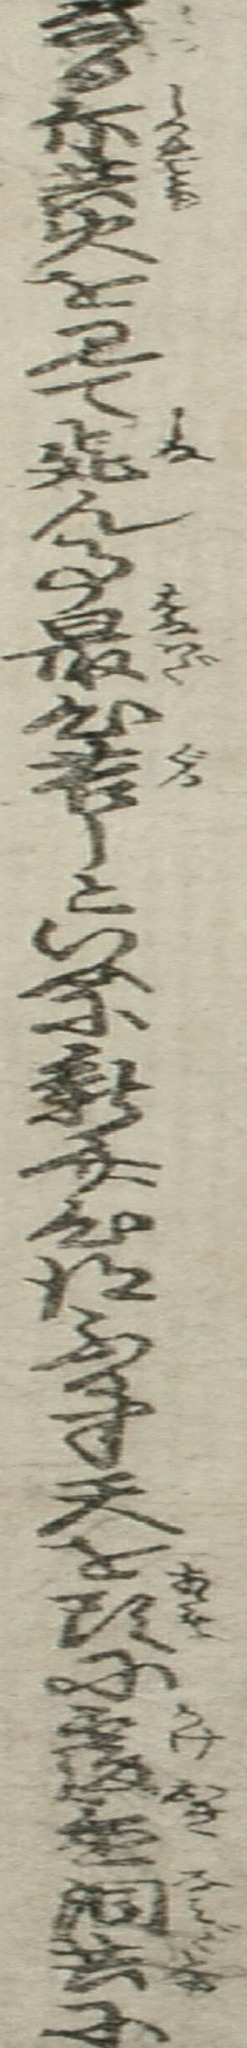なり尓共火を見て死ん事最心苦しといふに新介心得ふる半天を頭に覆置泪共に
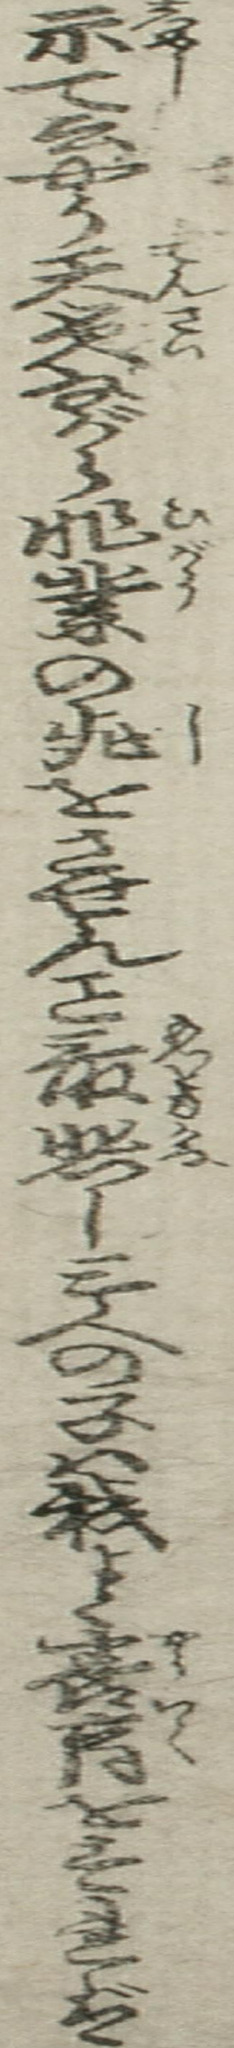示て云やう天災ながら非業の死をさせんこと最悲し三人の子は我よく養育をすれば
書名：安政見聞誌　上
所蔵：東京大学地震研究所図書室 Earthquake Research Institute Library, The University of Tokyo, JAPAN
